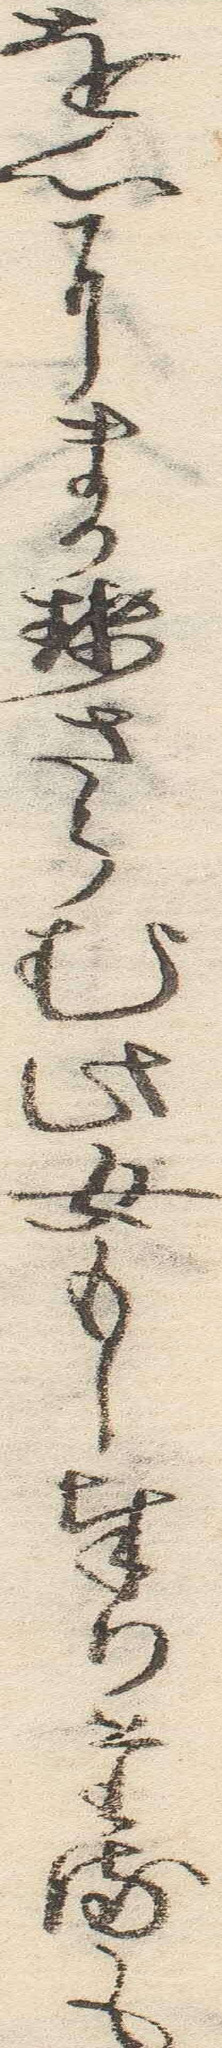を心にまかせさらむ此女もし奉りたるゝも
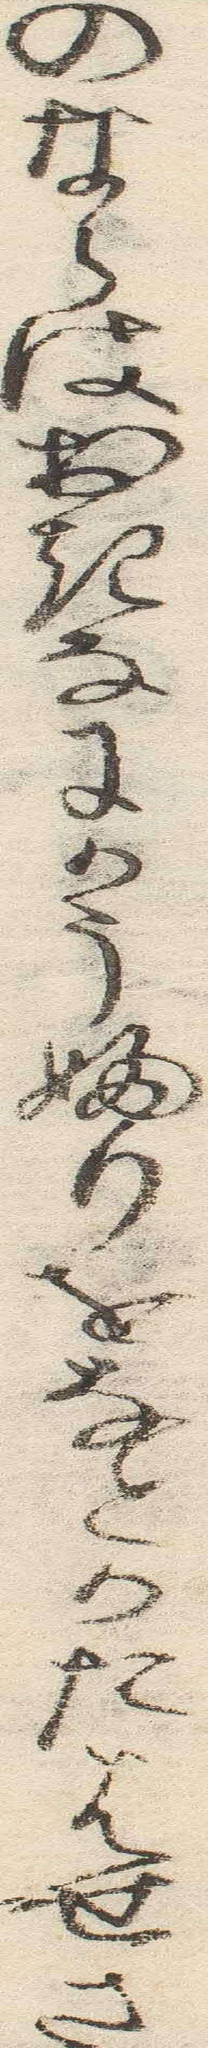のならはおきなにかうふりをなとかたはせさ
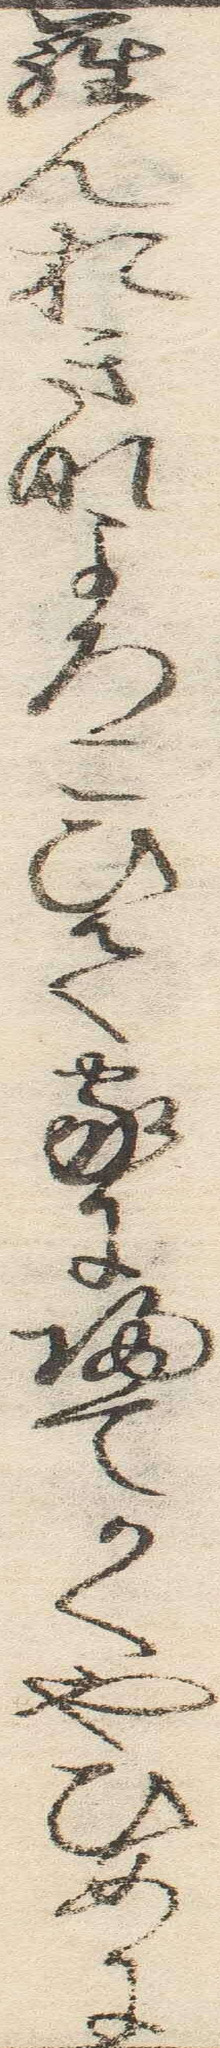らんおきなよろこひて家に帰てかくやひめに
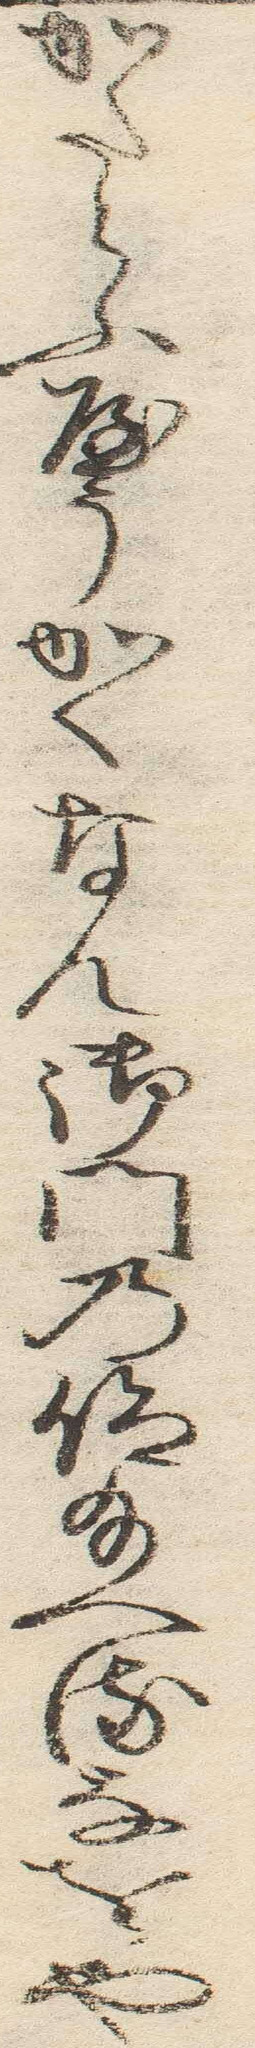かたらふやうかくなん御門の仰給へるなをや
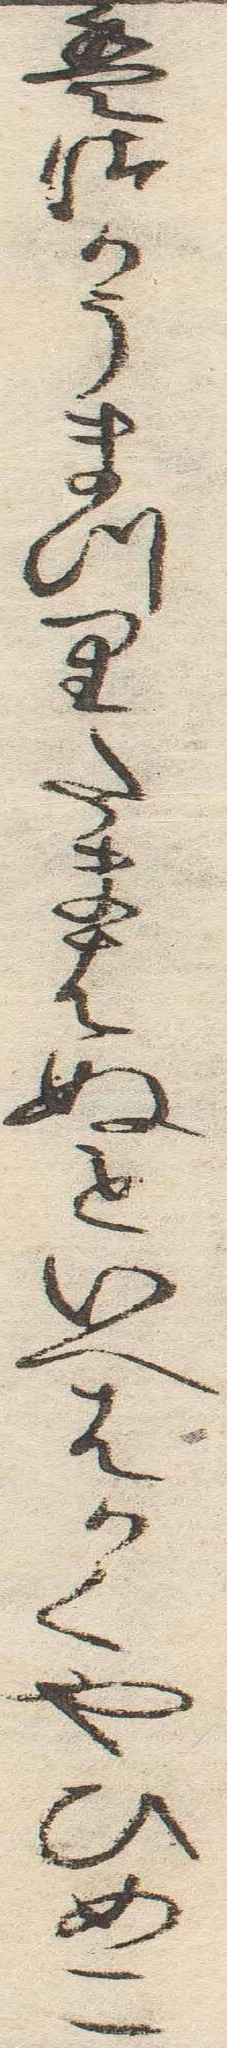はつかうまつりたまはぬといへはかくやひめこ
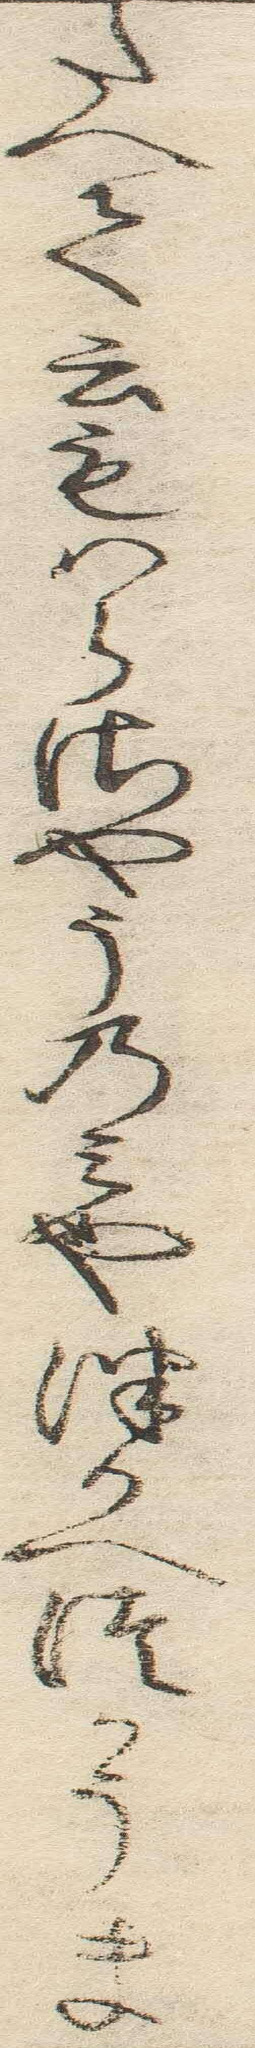たへて云もはらさやうのみやつかへつかうま
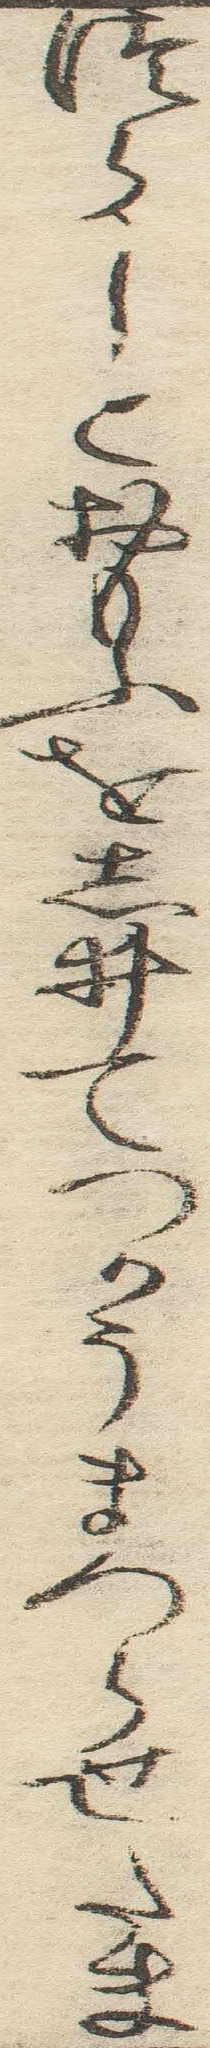つらしとおもふをしゐてつかうまつらせたま
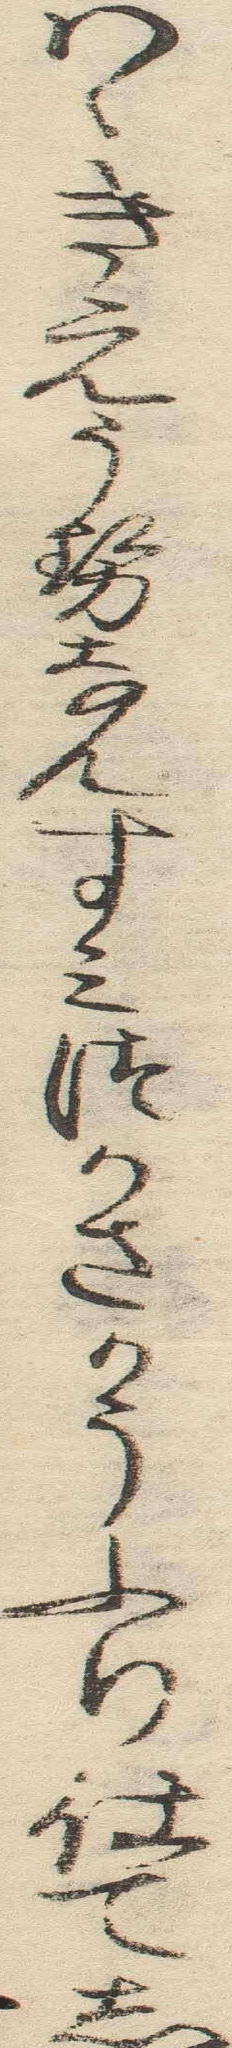はゝきえうせなんすみつかさかうふり仕てし

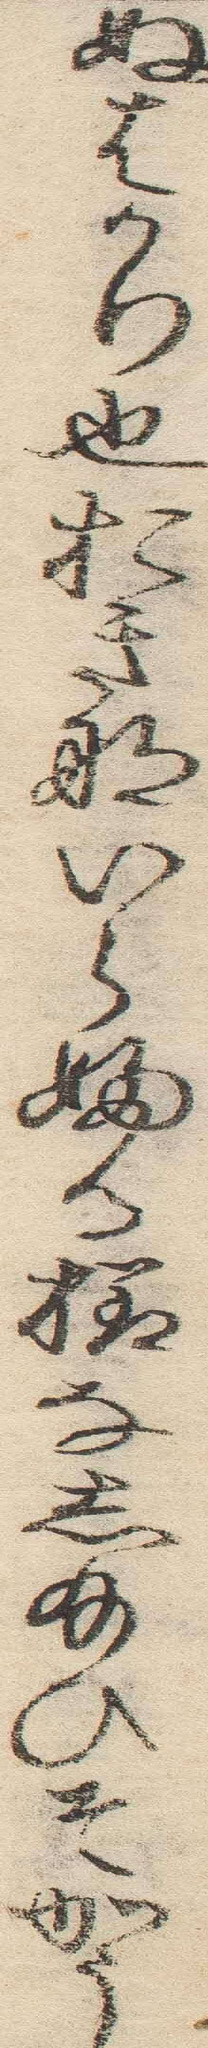ぬはかり也おきないらふる様なし給ひそかう
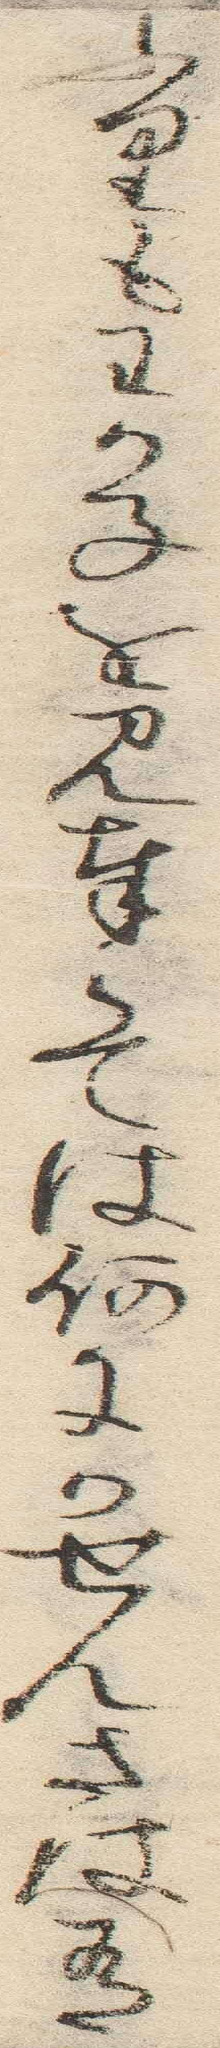ふりもわか子を見奉らては何にかせんさは有
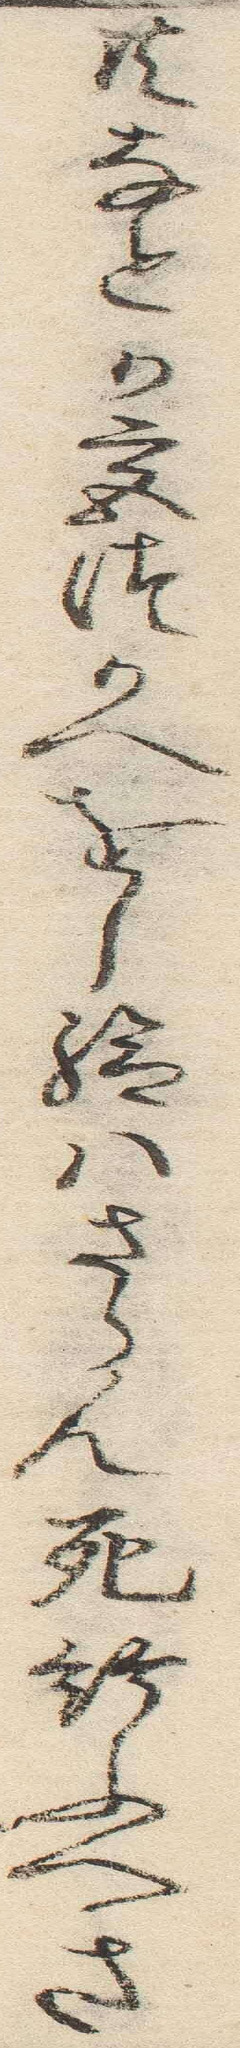共なとか宮つかへをし給はさらん死給ふへき
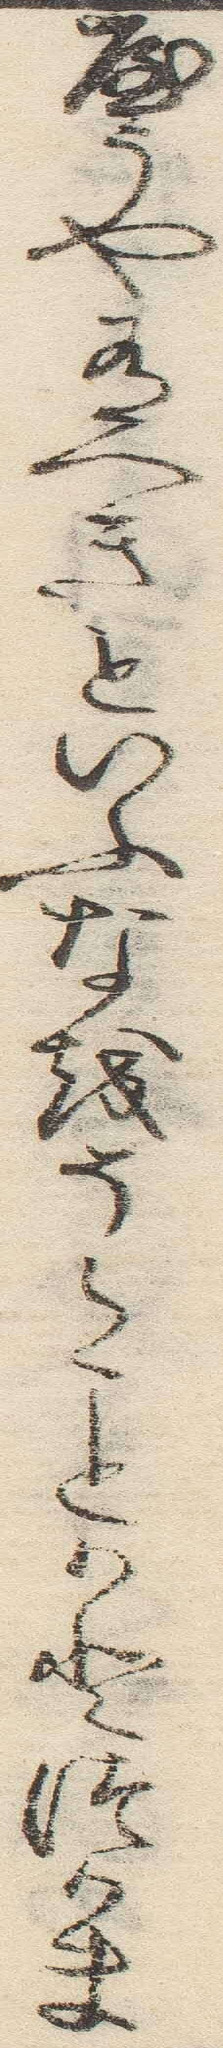やうや有へきといふなをそらことかとつかま
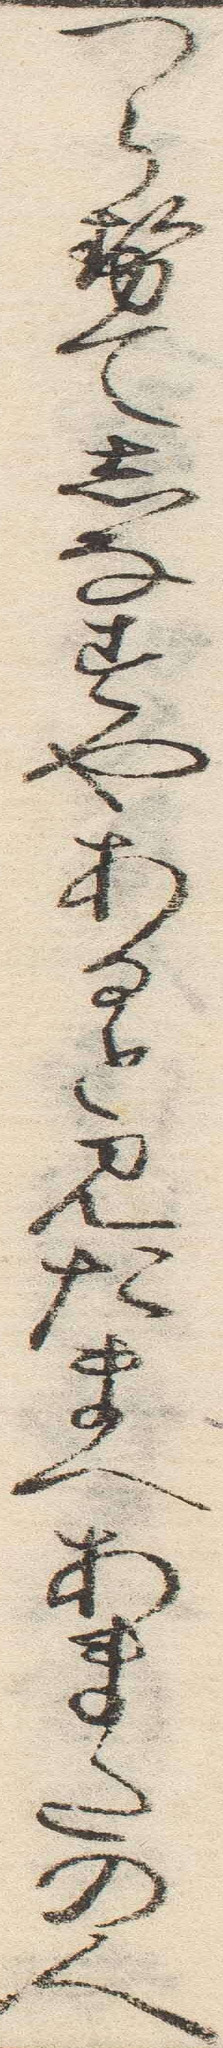つらせてしなすやあると見たまへあまたの人
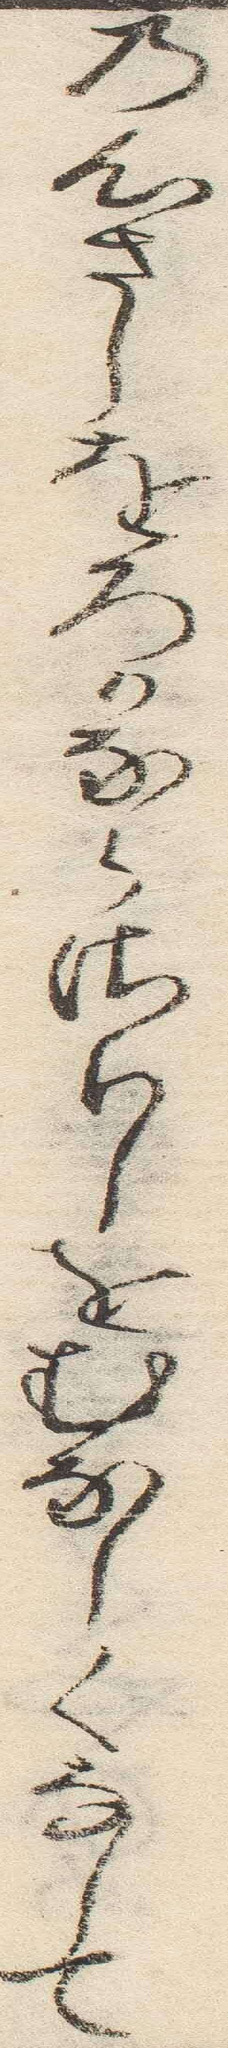の心さしをろかならさりしをむなしくなして
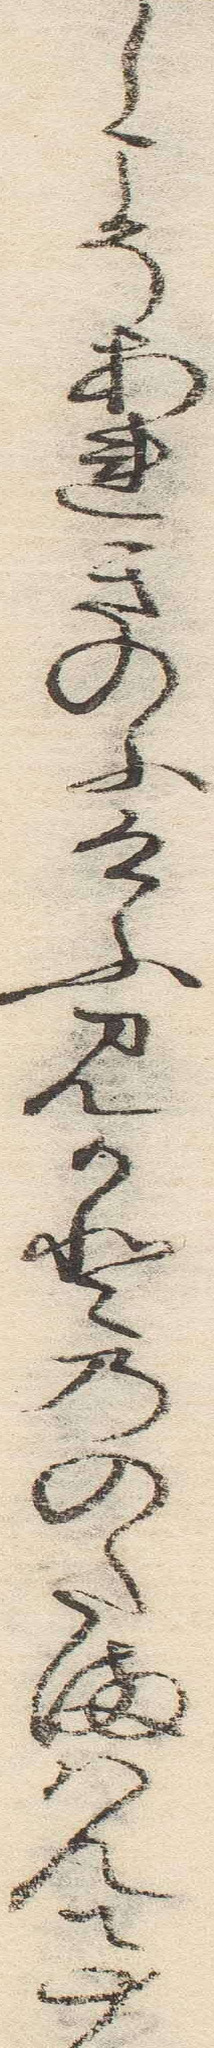しこそあれきのふけふみかとののたまはん事
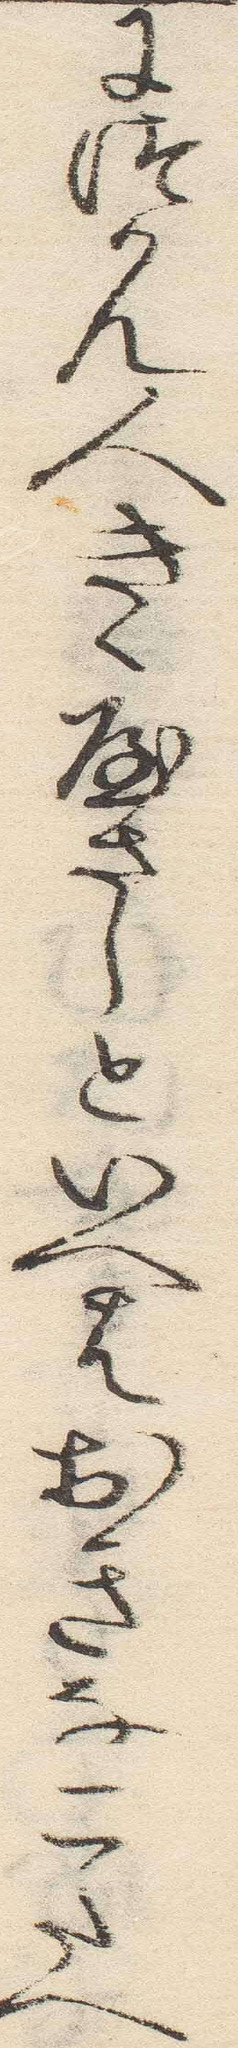につかん人きゝやさしといへはおきなこたへ
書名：竹取物語
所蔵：東京学芸大学附属図書館 国文学研究資料館
